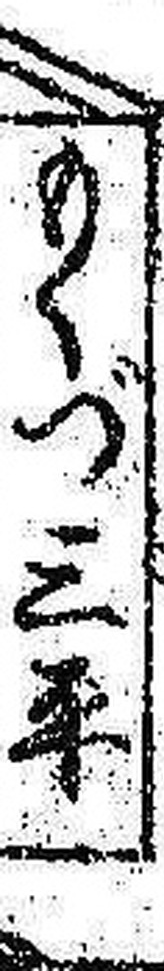もくづ三平
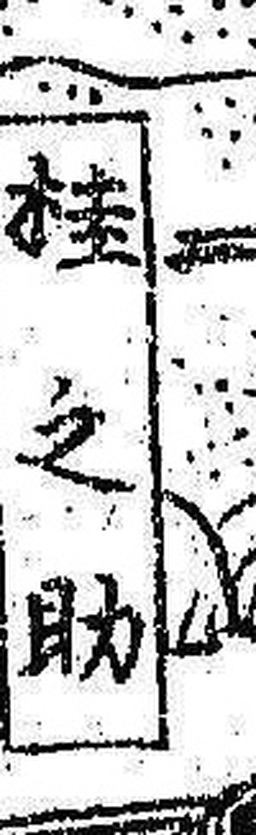桂之助
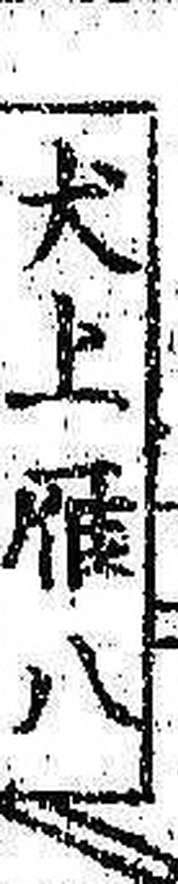犬上雁八

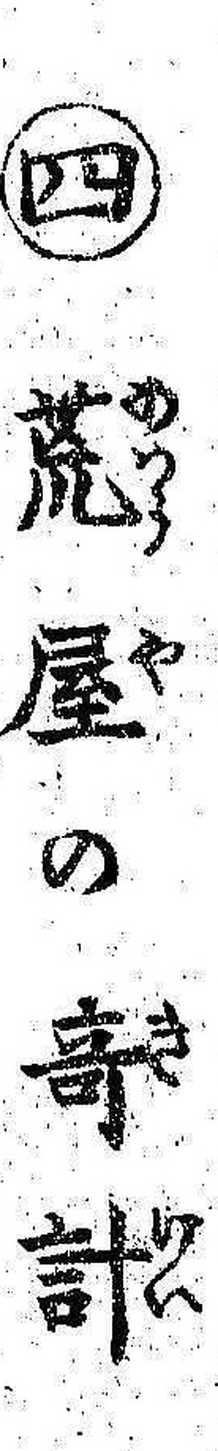四荒屋の奇計
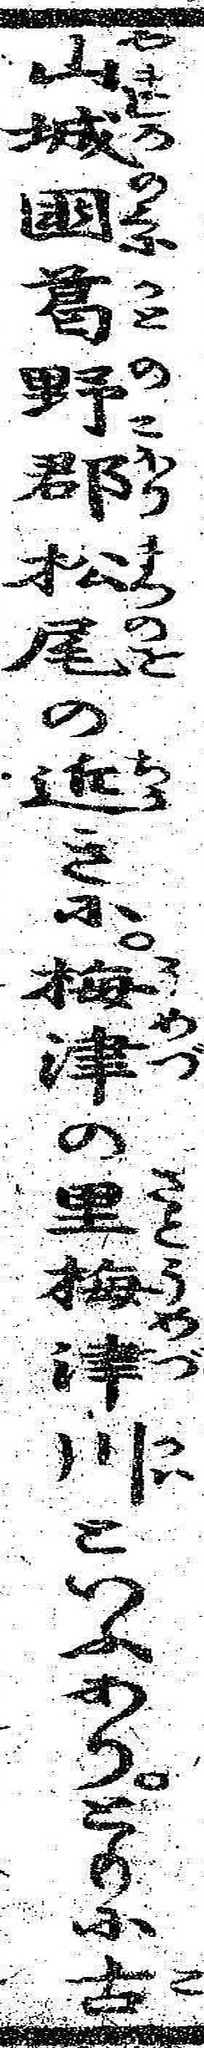山城国葛野郡松尾の近きに。梅津の里梅津川といふあり。ともに古
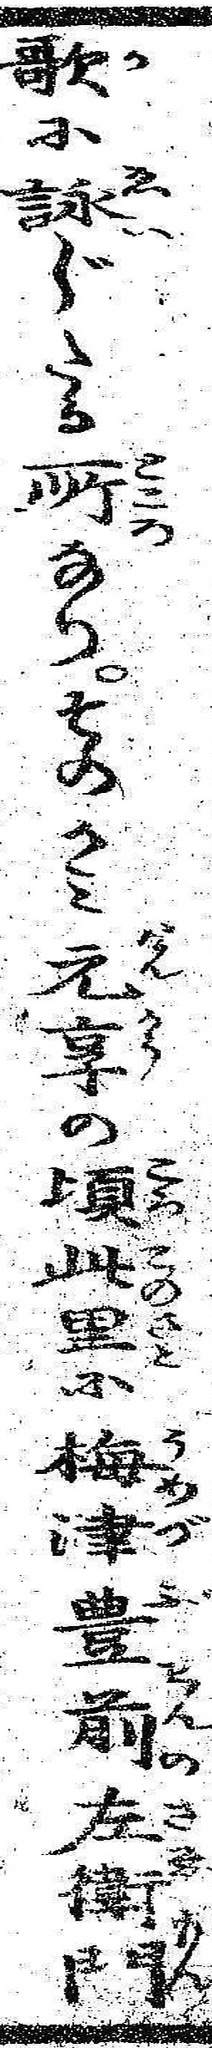歌に詠じたる所なり。そのかみ元享の頃此里に梅津豊前左衛門
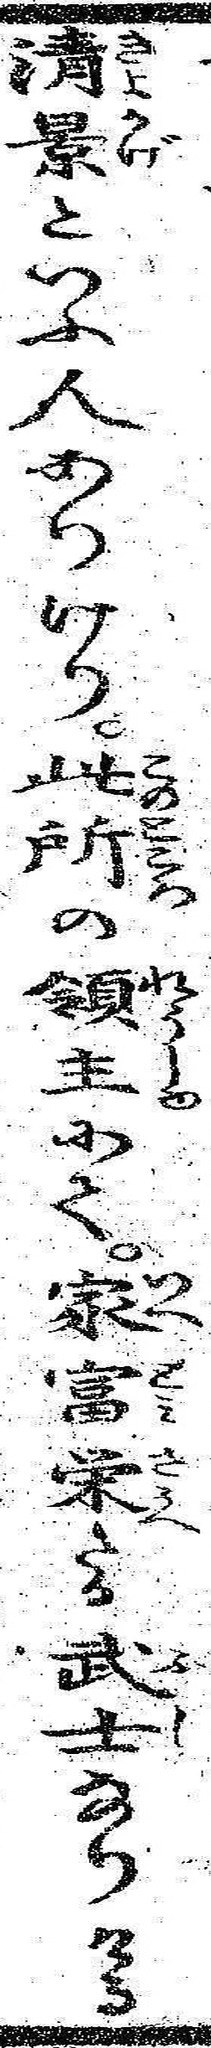清景といふ人ありけり。此所の領主にて。家富栄たる武士なりける
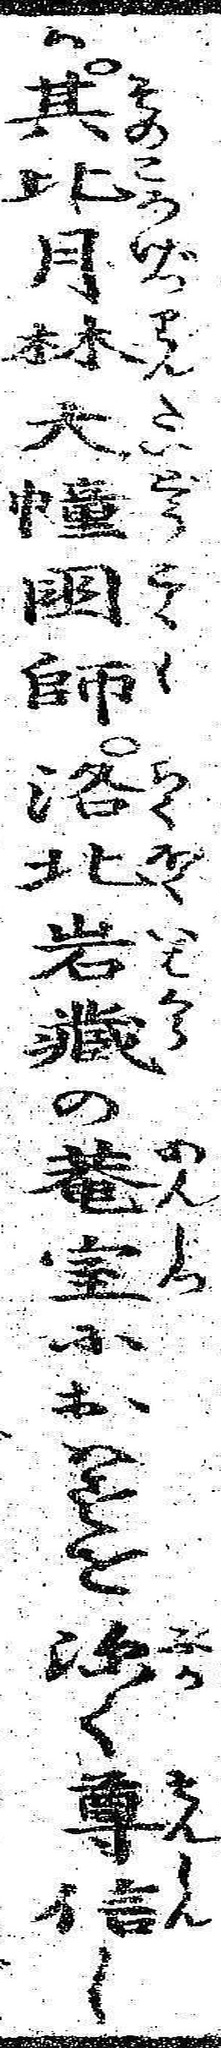か。其頃月林大幢国師。洛北岩蔵の庵室におはすを深く尊信し
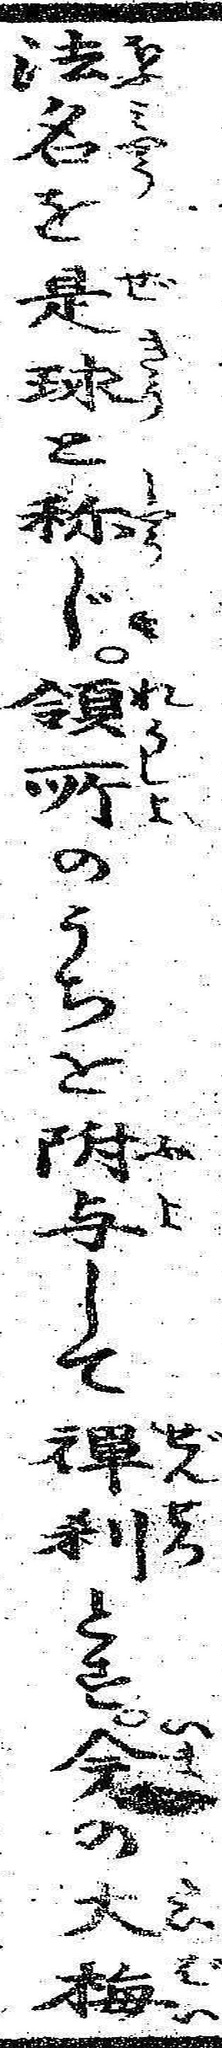法名を是球と称じ。領所のうちを附与して禅刹とす。今の大梅
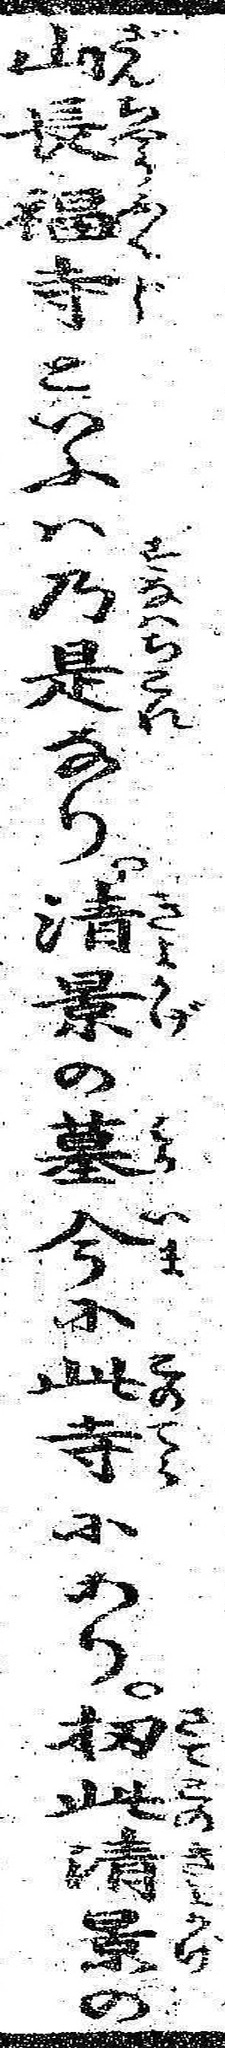山長福寺といふは乃是なり。清景の墓今に此寺にあり。扨此清景の
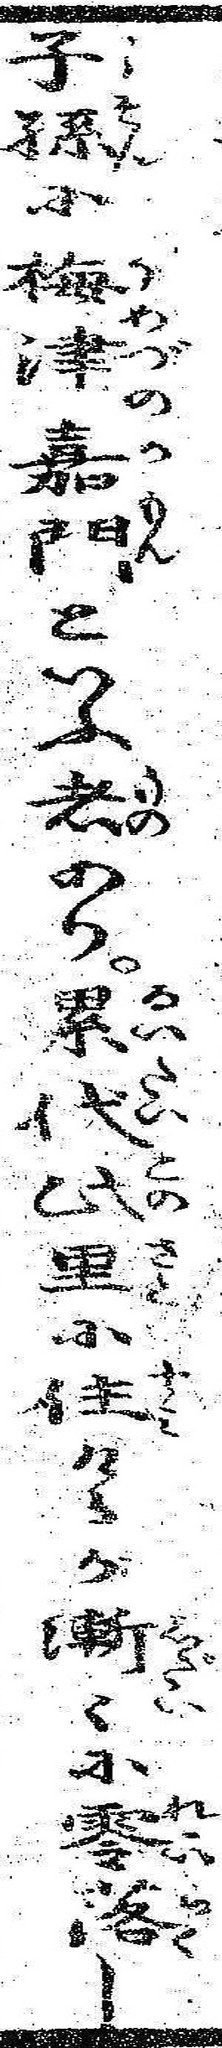子孫に梅津嘉門といふ者あり。累代此里に住けるが漸々に零落し
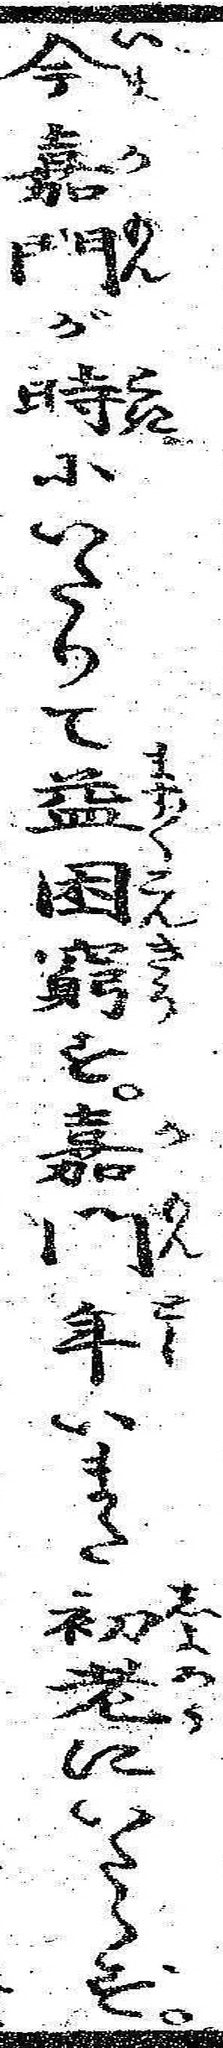今嘉門が時にいたりて益困窮す。嘉門年いまた初老にいたらず。
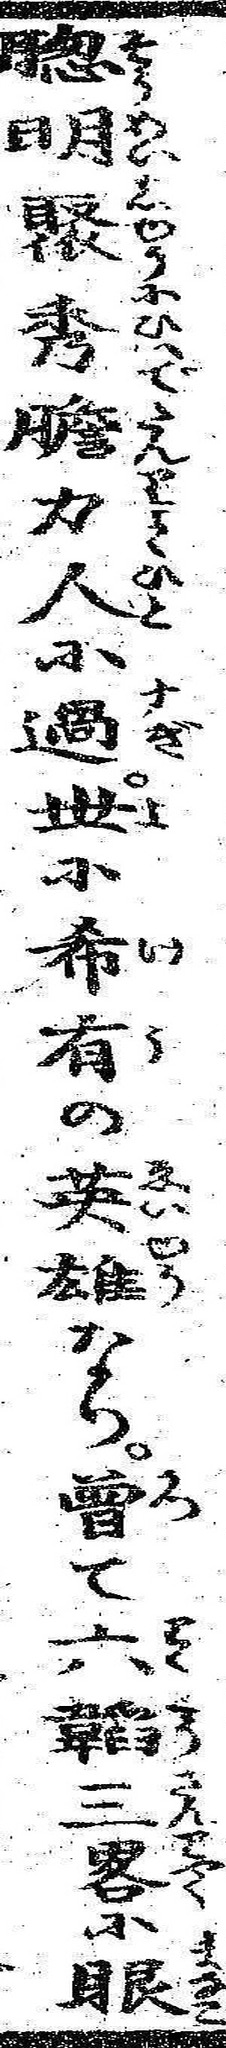聡明聚秀胆力人に過。世に希有の英雄なり。曽て六韜三略に眼
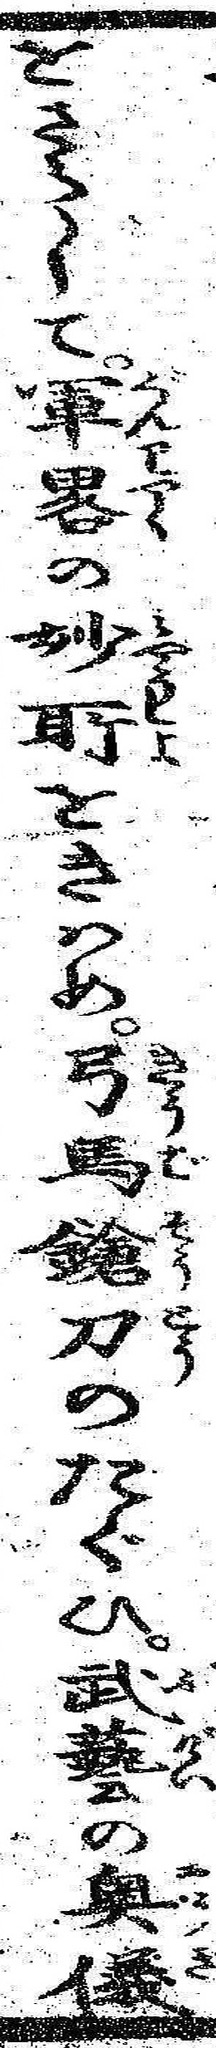をさらして。軍略の妙所をきはめ。弓馬鎗刀のたぐひ。武芸の奥儀
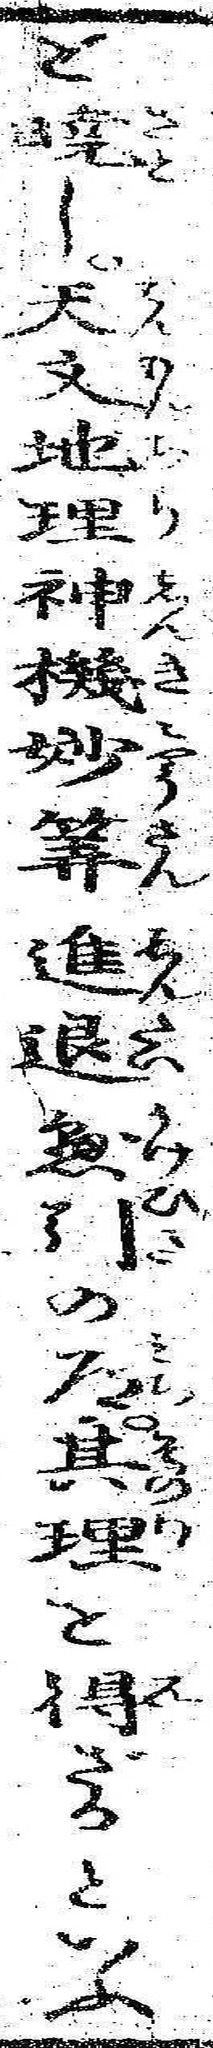を暁し。天文地理神機妙算進退懸引の道。其理を得ざるといふ
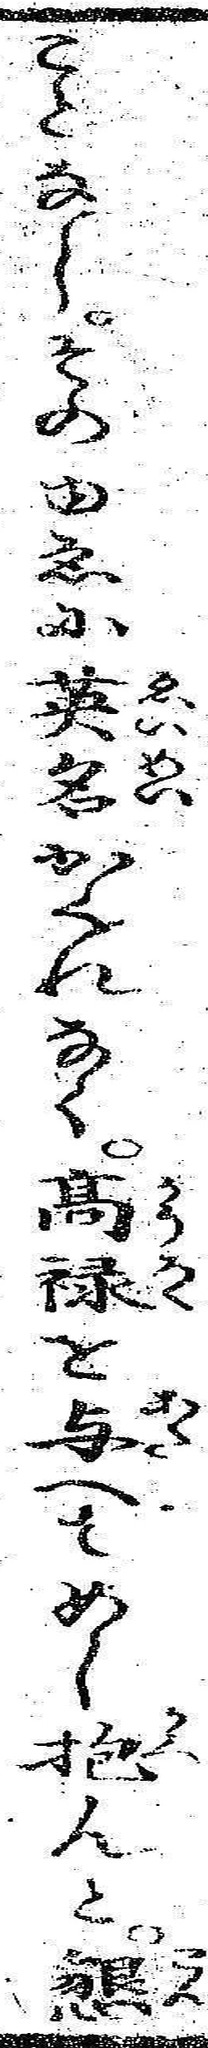ことなし。そのゆゑに英名かくれなく。高禄を与へてめし抱んと。懇
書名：昔話稲妻表紙
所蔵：国文学研究資料館
